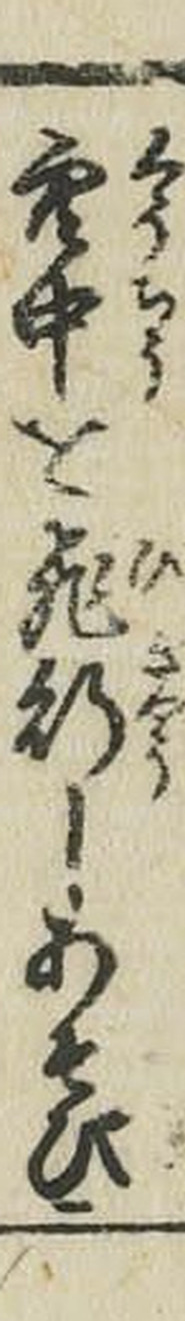空中を飛行しあそび
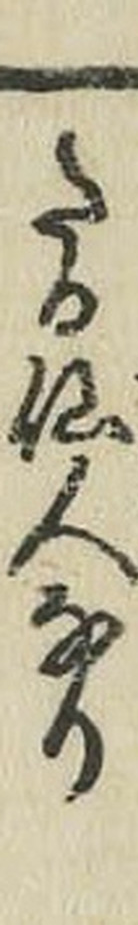たる仙人なり
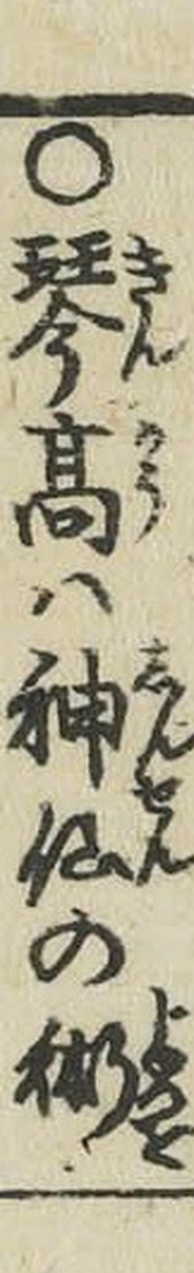○琴高は神仙の術
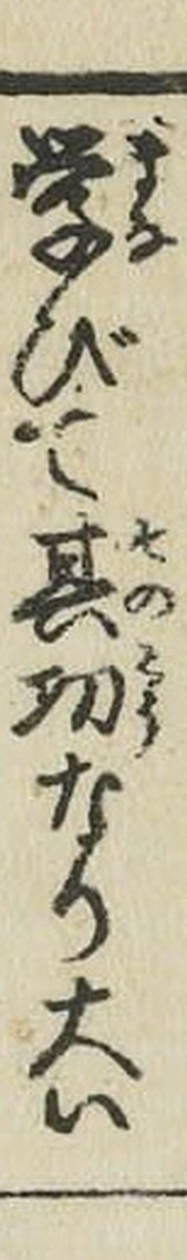学びて其功なり大い
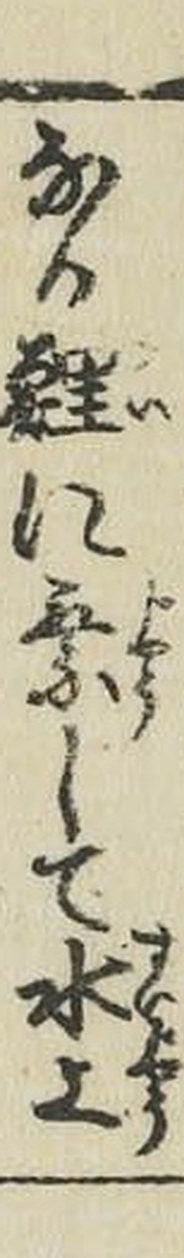なる鯉に乗して水上
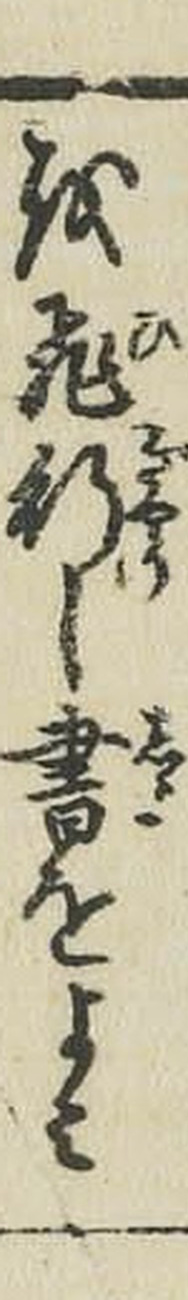を飛行し書をよみ
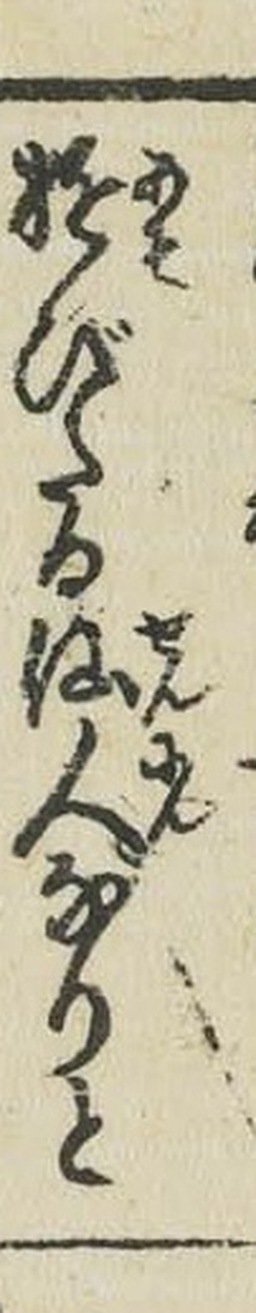遊びたる仙人なりと
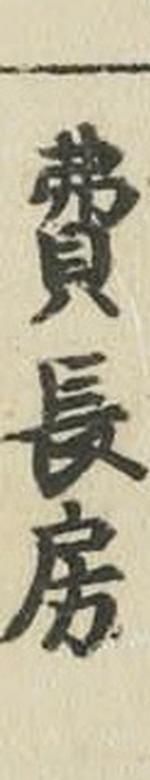費長房
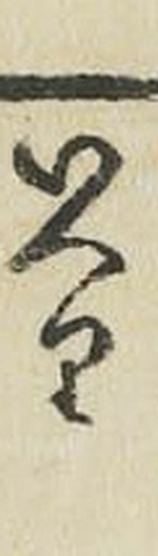いへり
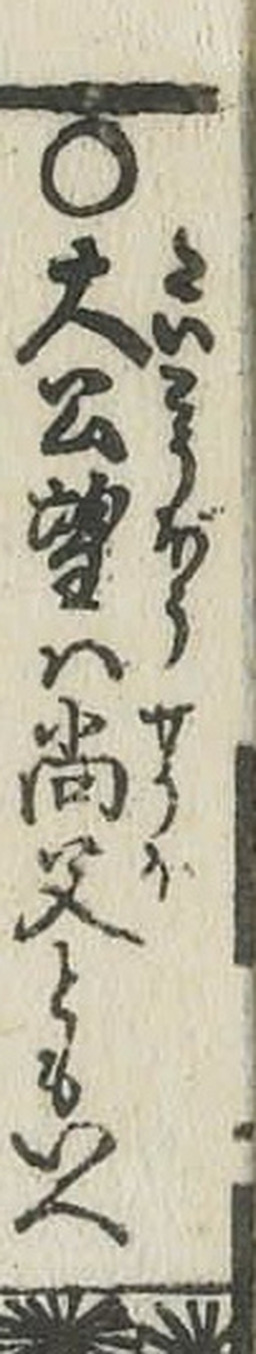○大公望は尚父ともいへ
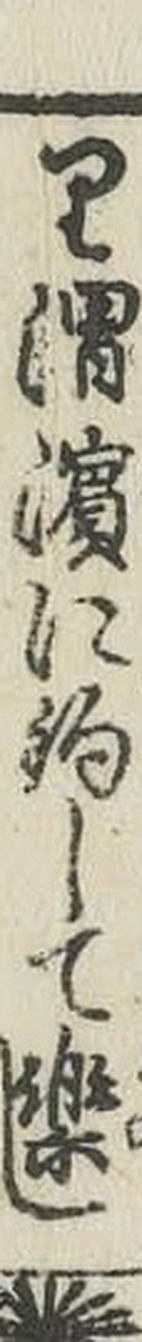り渭浜に釣して楽し
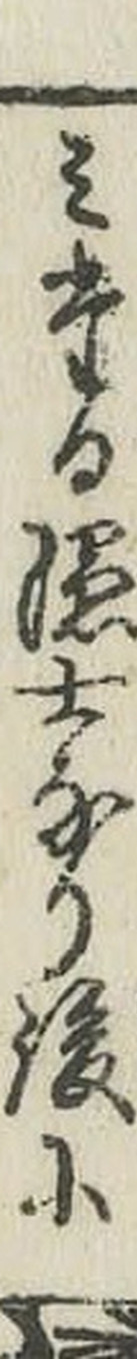みたる隠士なり後に
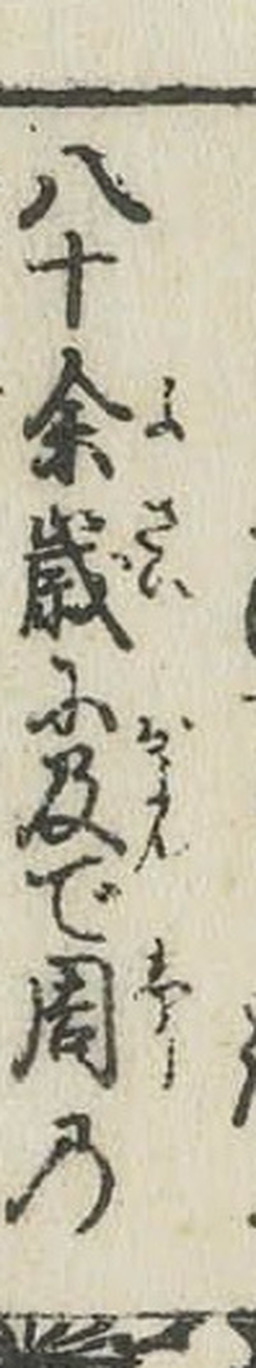八十余歳に及で周の
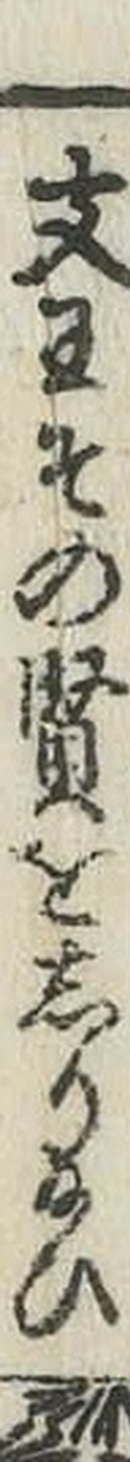文王その賢をしり給ひ
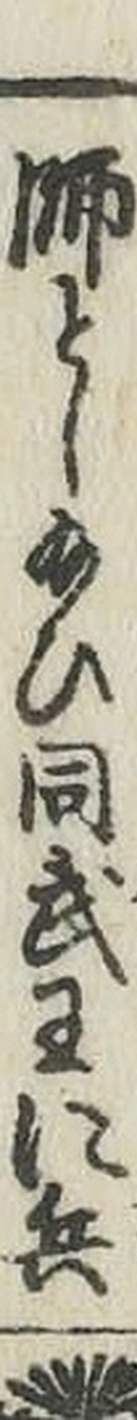師とし給ひ同武王に兵
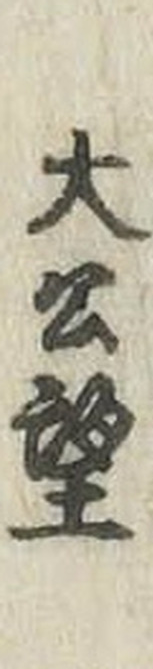大公望
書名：増補頭書訓蒙図彙大成 10巻 10:巻之21
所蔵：東京学芸大学教育コンテンツアーカイブ
